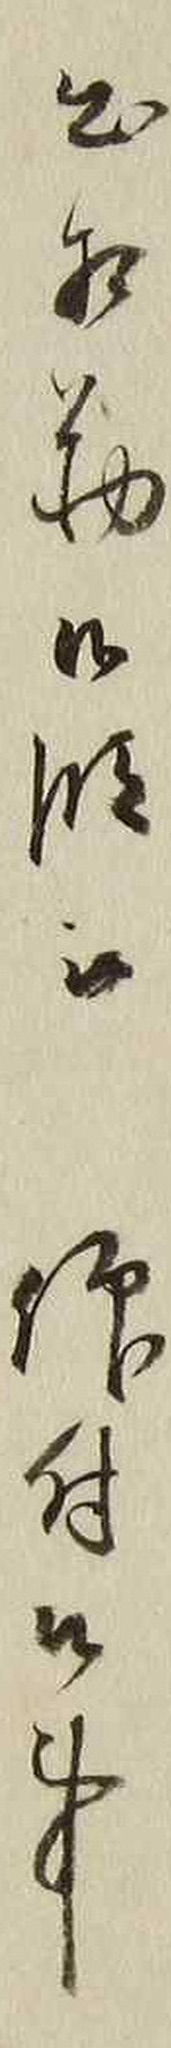出相勤候段被仰付候事
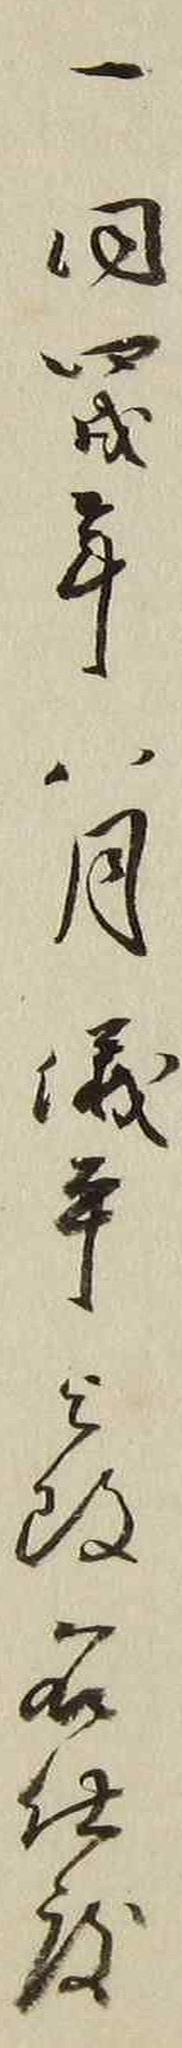一同四戌年八月儀平と改名仕度
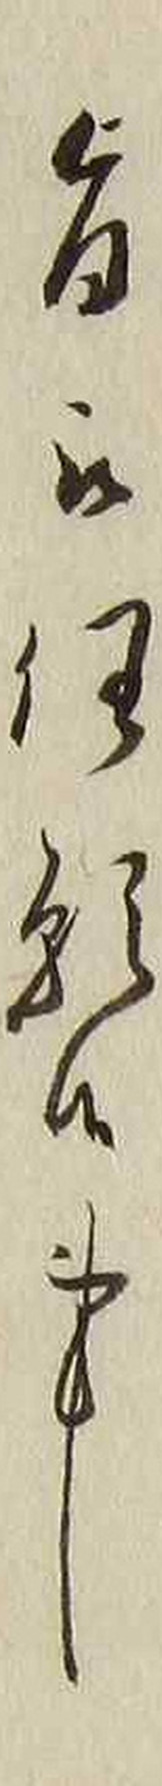旨被任願候事
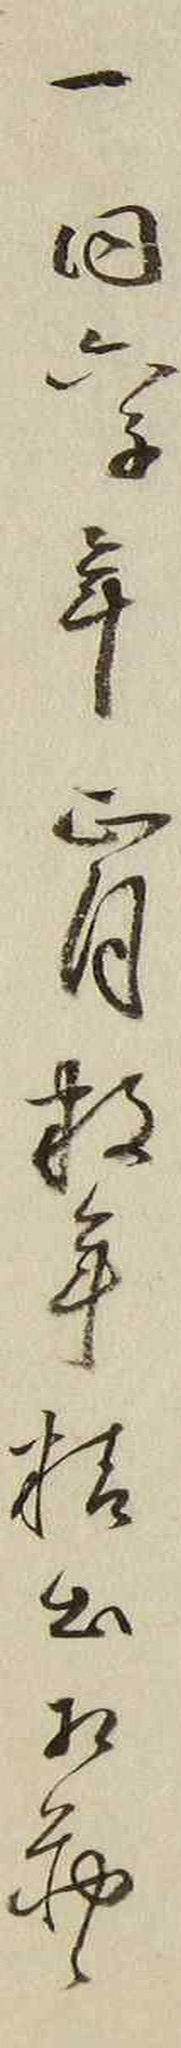一同六子年正月数年精出相勤候
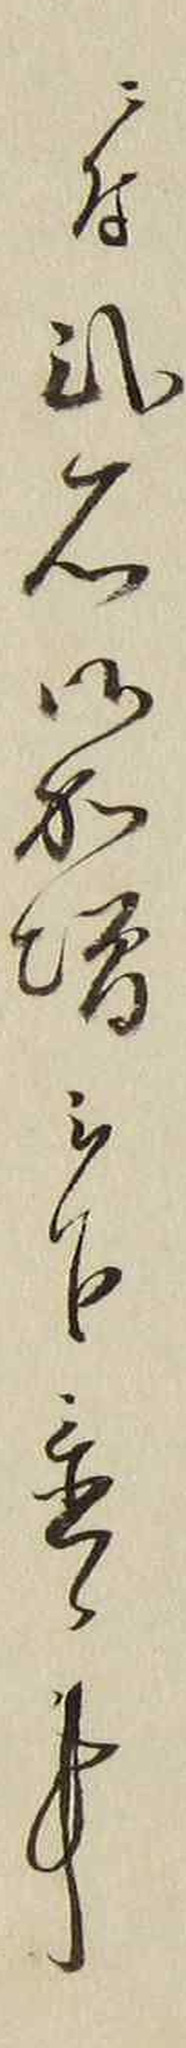ニ付弐石御加増被下置候事

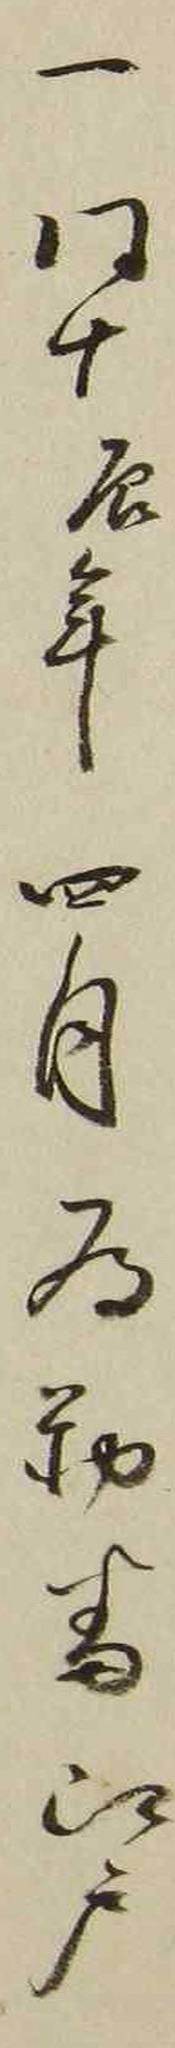一同十辰年四月為勤番江戸
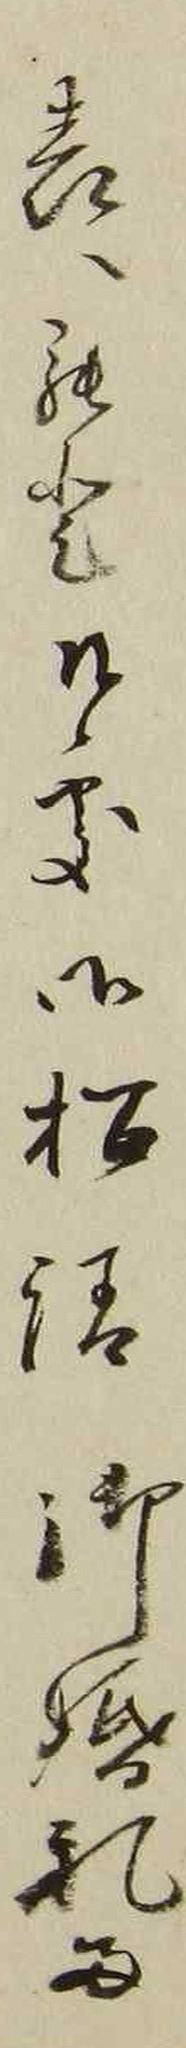表へ罷登候処御招請御婚礼両
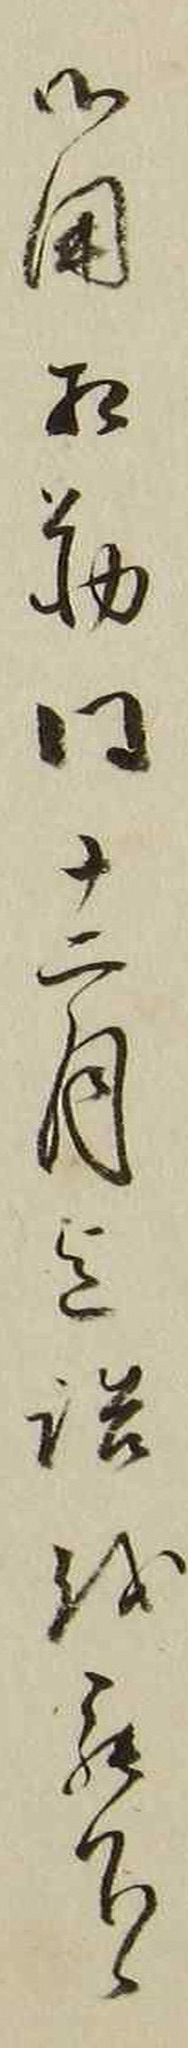御用相勤同十二月迄詰越罷下候
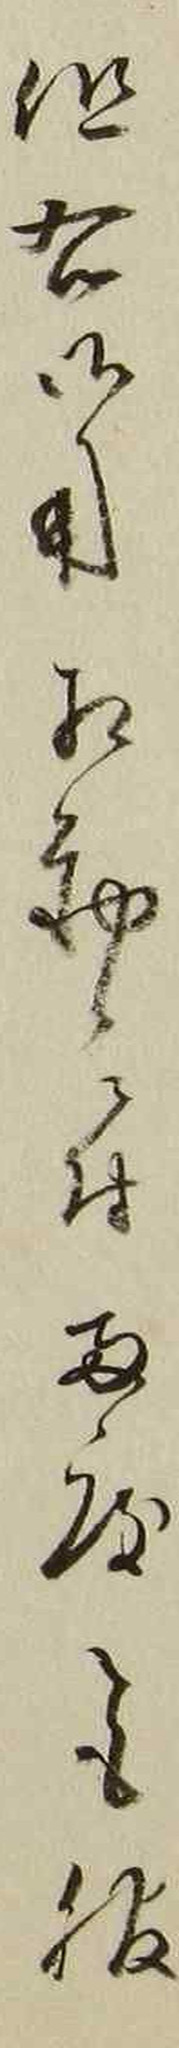但右御用相勤候ニ付両度とも服
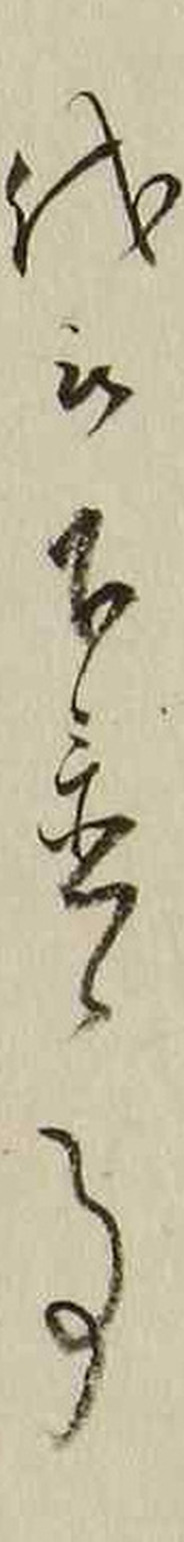代被下置候事
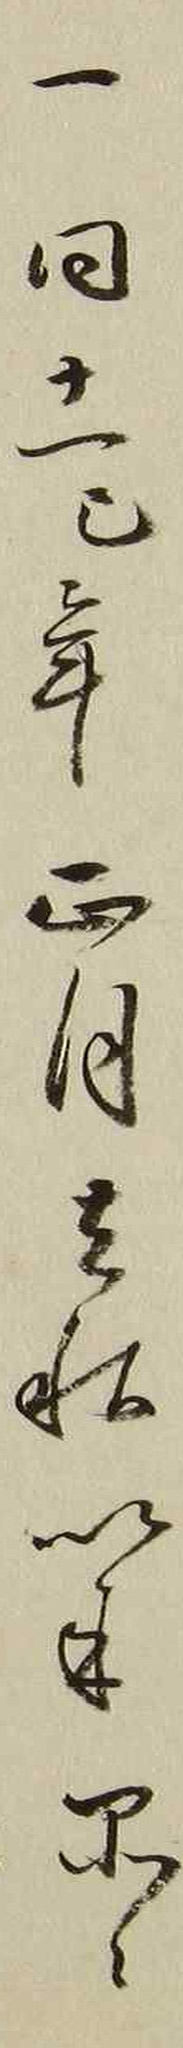一同十一巳年正月去秋以来品々
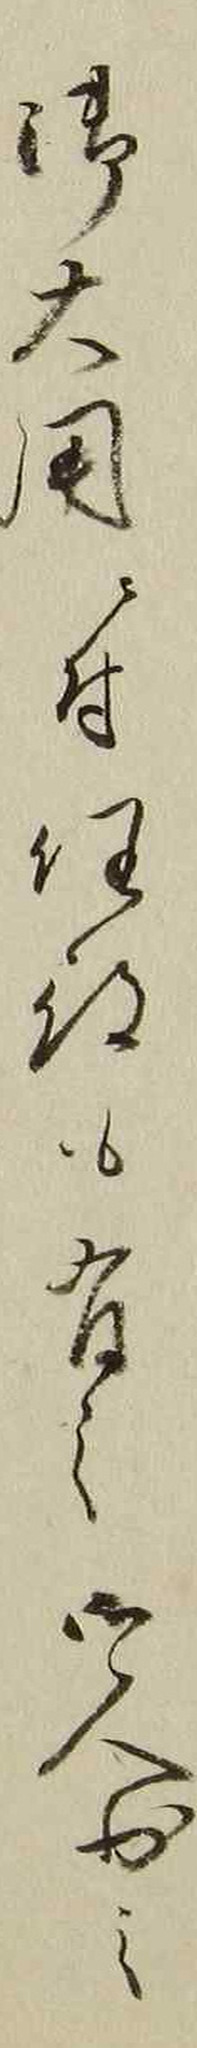御大用ニ付任役も有之御人少之
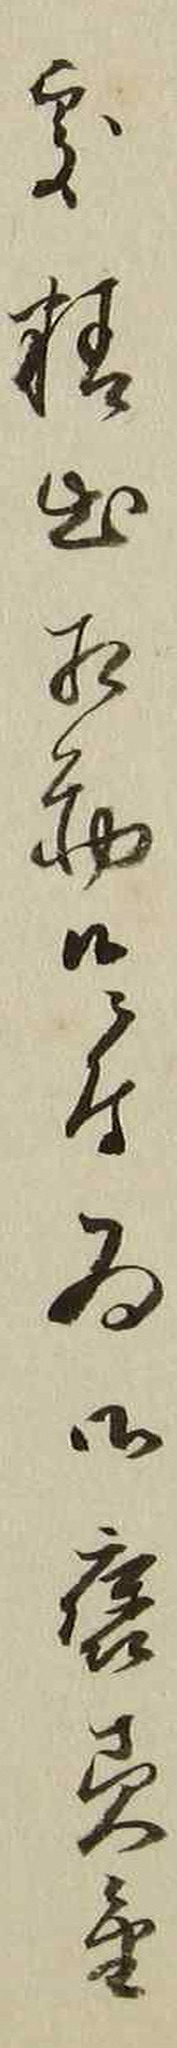処精出相勤候ニ付為御褒美金
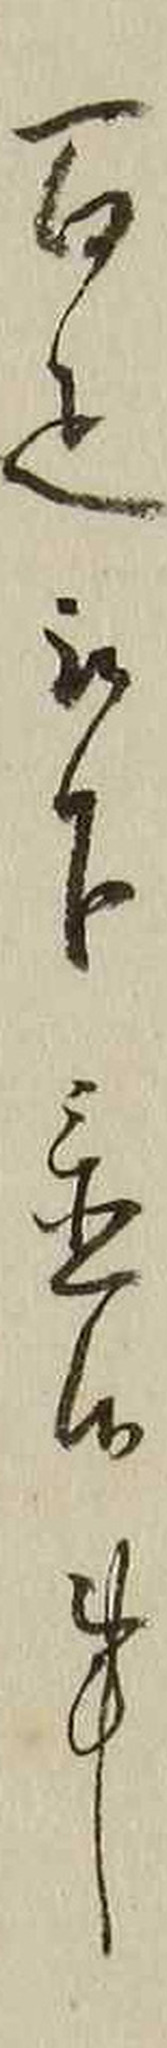百疋被下置候事
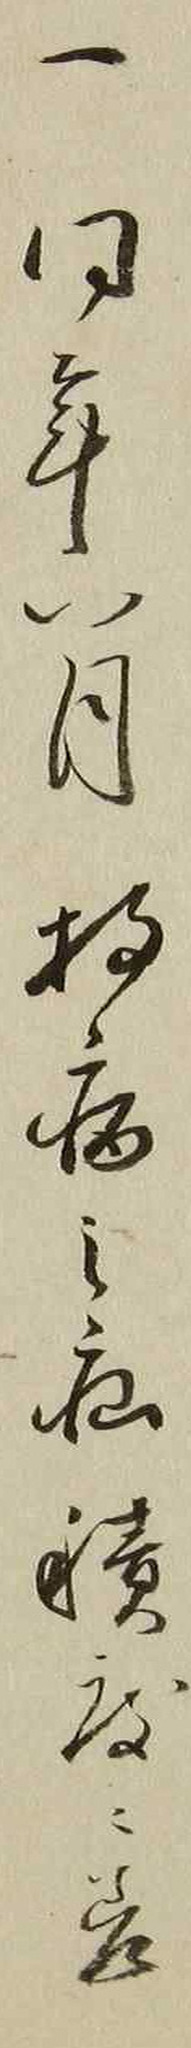一同年八月持病之疝積度々差
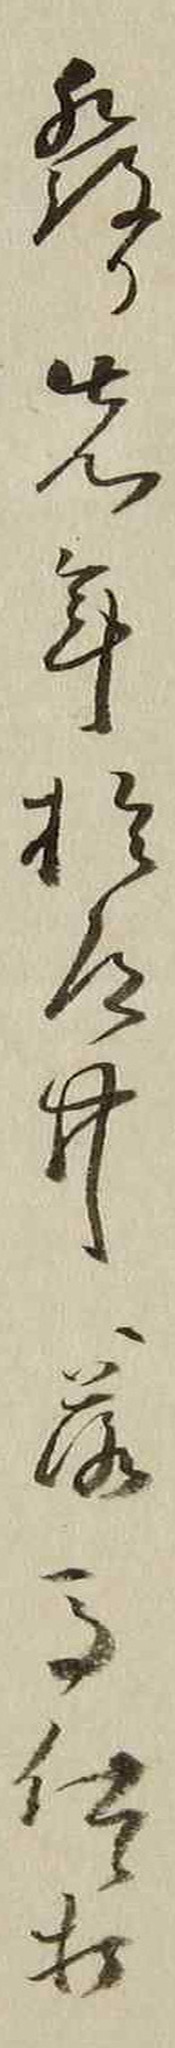発り先年於道中落馬仕候打
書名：諸士系譜　巻之52　に之部3
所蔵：会津若松市立会津図書館
